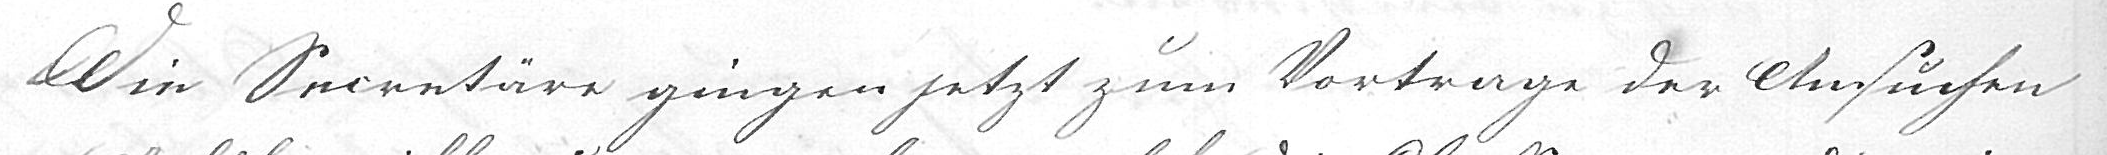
Die Secretäre gingen jetzt zum Vortrage der Ansuchen
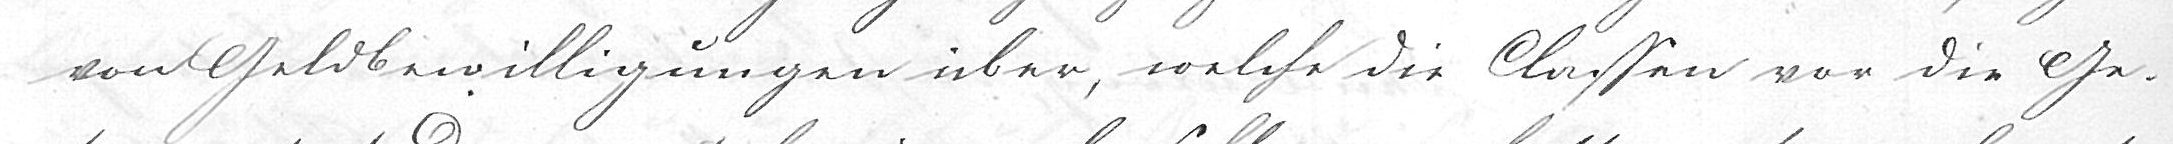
von Geldbewilligungen über, welche die Classen vor die Ge-
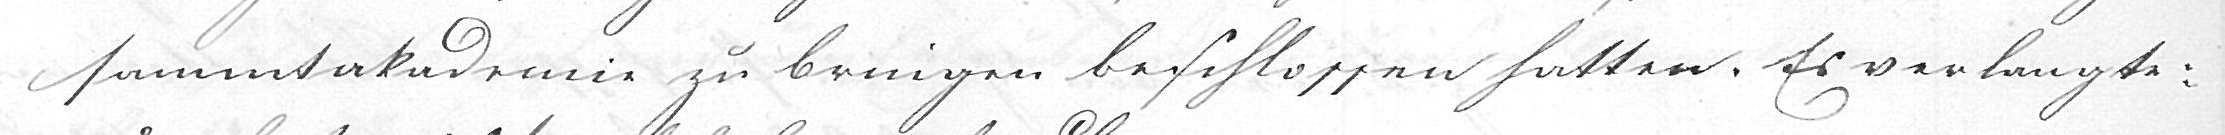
sammtakademie zu bringen beschlossen hatten. Es verlangte:
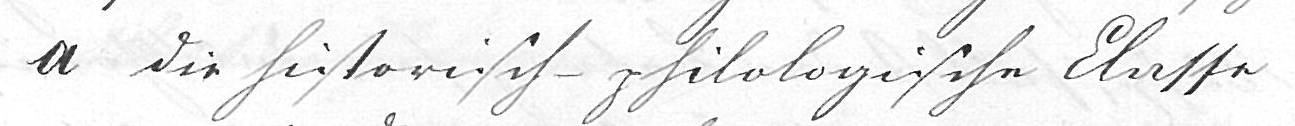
a. die historisch-philologische Classe
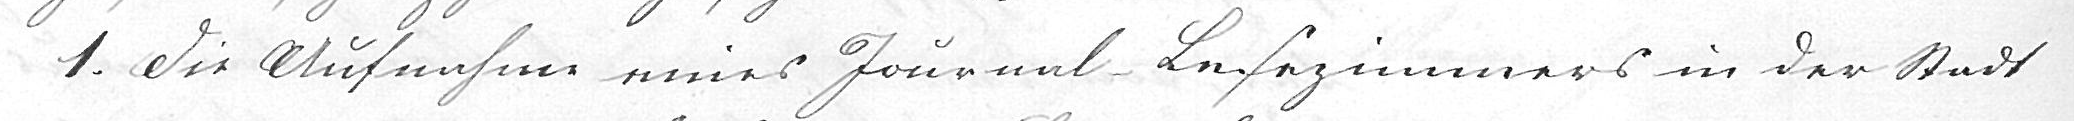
1. Die Aufnahme eines Journal-Lesezimmers in der Stadt
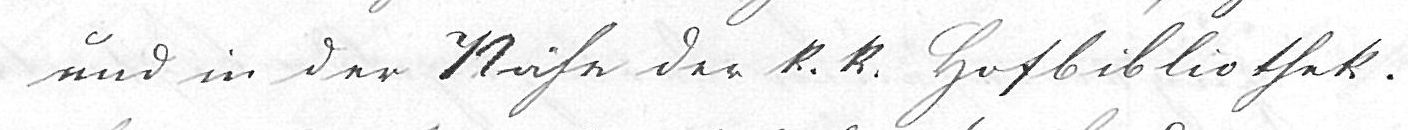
und in der Nähe der k.k. Hofbibliothek.
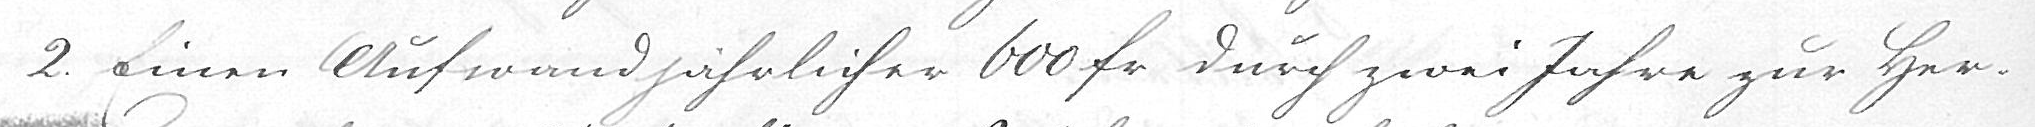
2. Einen Aufwand jährlicher 600 fr durch zwei Jahre zu Her-
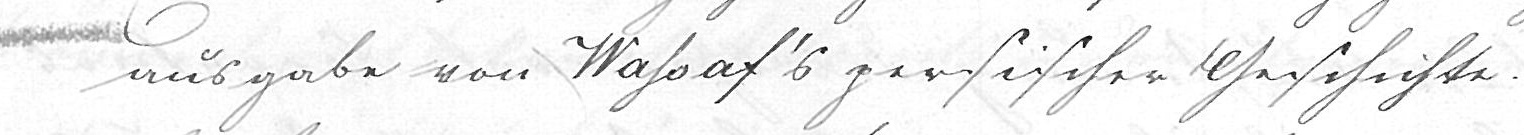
ausgabe von Wassaf's persischer Geschichte.
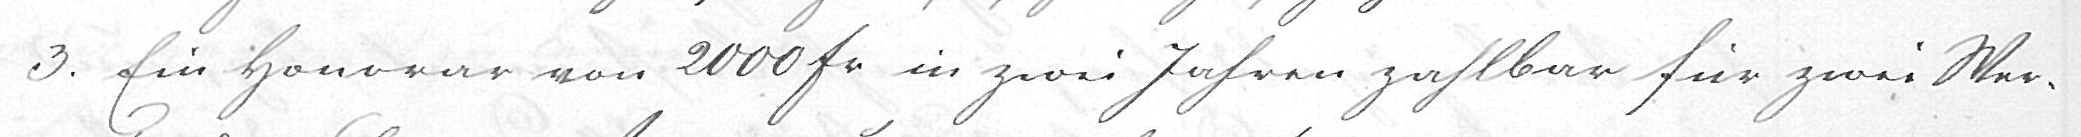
3. Ein Honorar von 2000 fr in zwei Jahren zahlbar für zwei Wer-
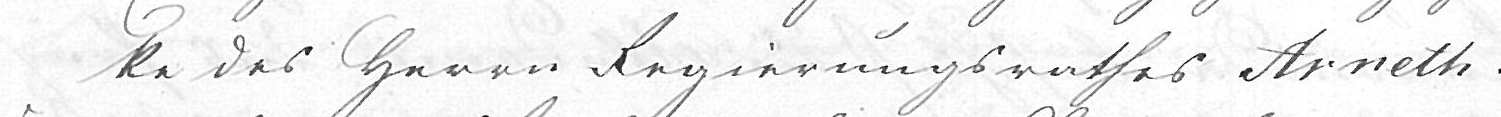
ke des Hern Regierungsrathes Arneth.
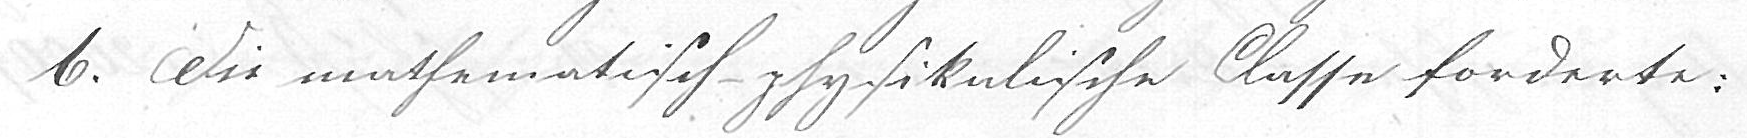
b. Die mathematisch-physikalische Classe forderte:
